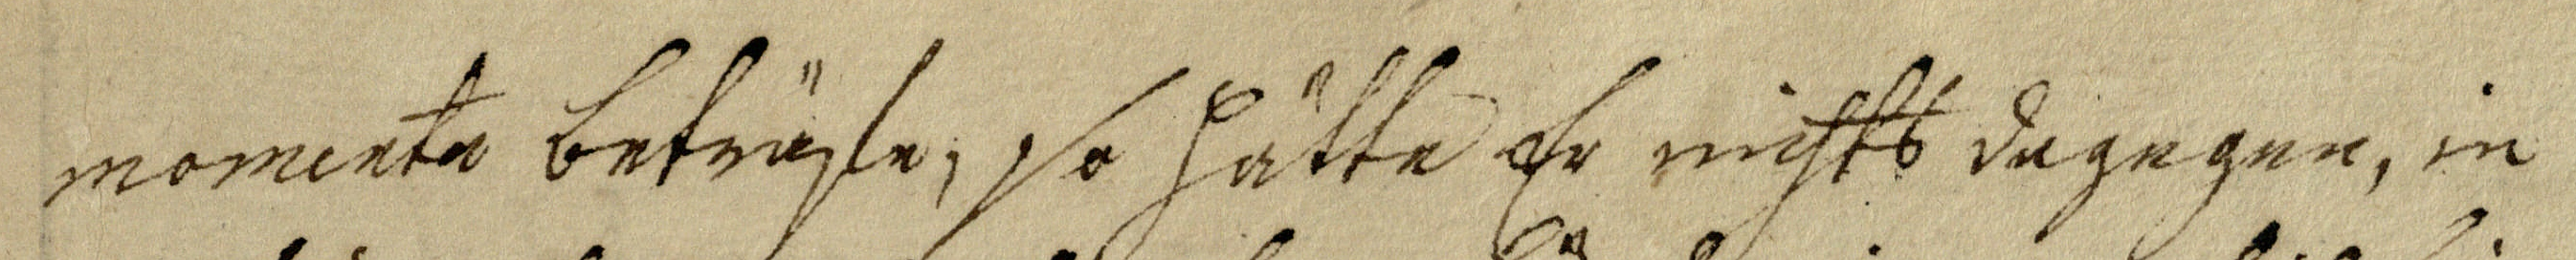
momenta beträfe, so hätte Er nichts dagegen, in
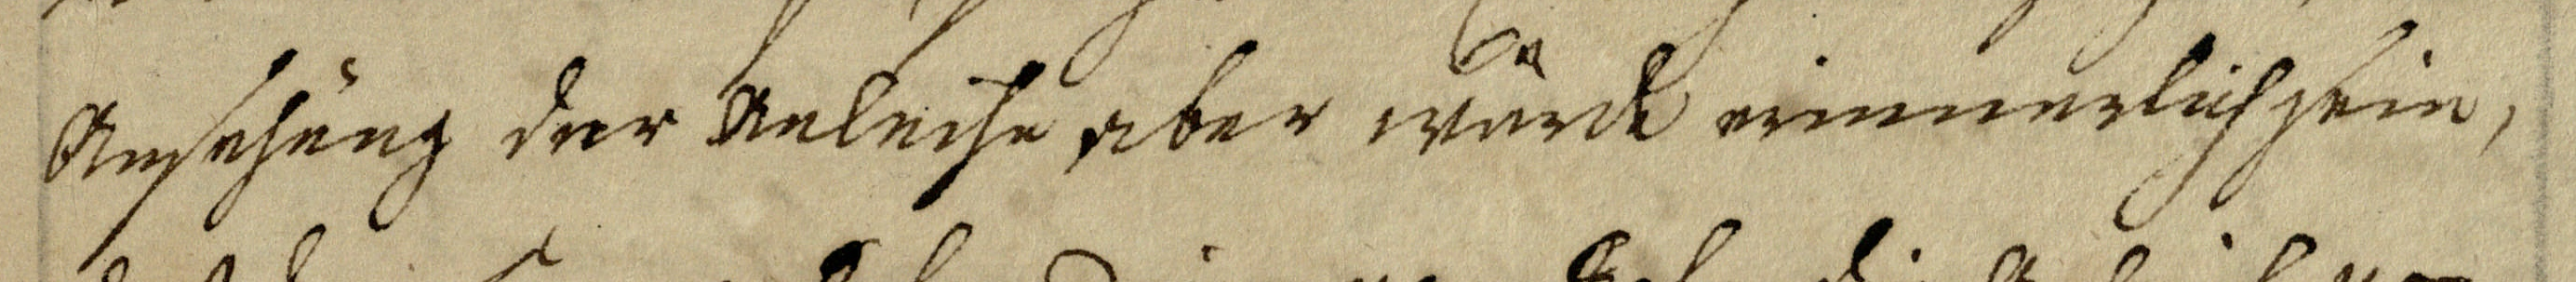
Ansehung der Anleihe aber würde erinnerlich sein,
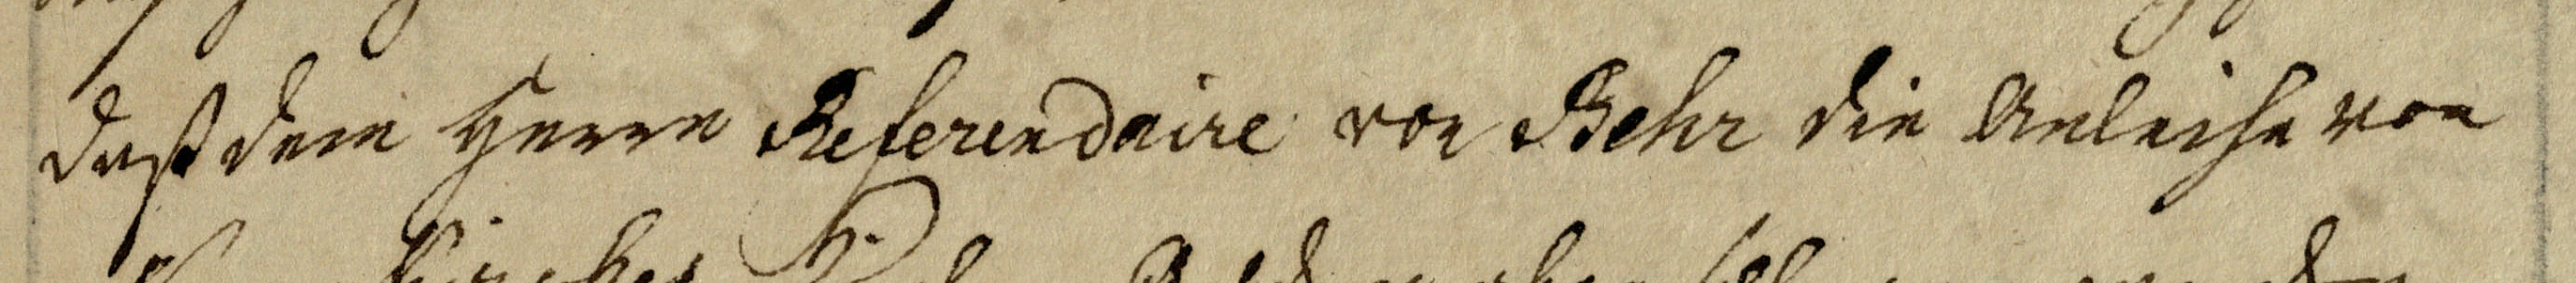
daß dem Herrn Referendaire vor Behr die Anleihe von
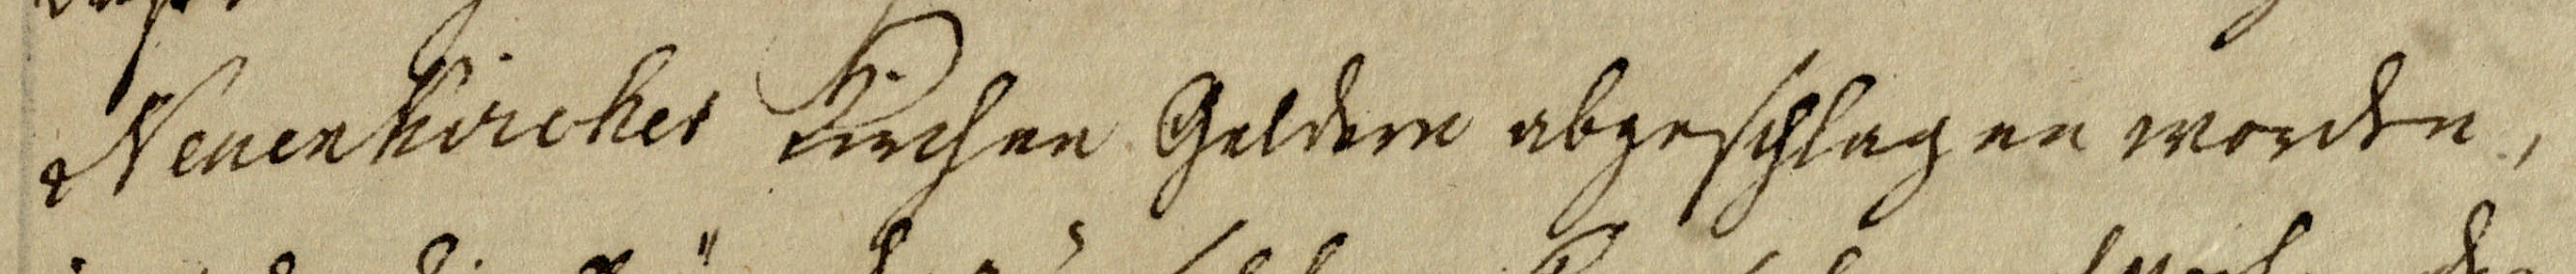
Neuenkircher Kirchen Geldern abgeschlagen worden,
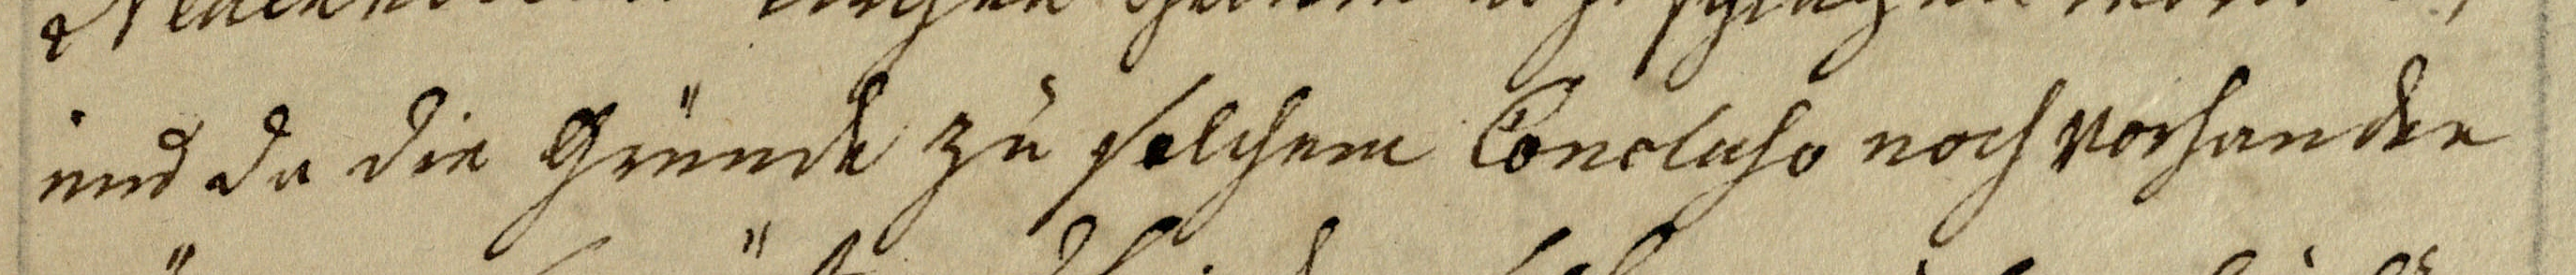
und da die Gründe zu solchem Concluso noch vorhanden
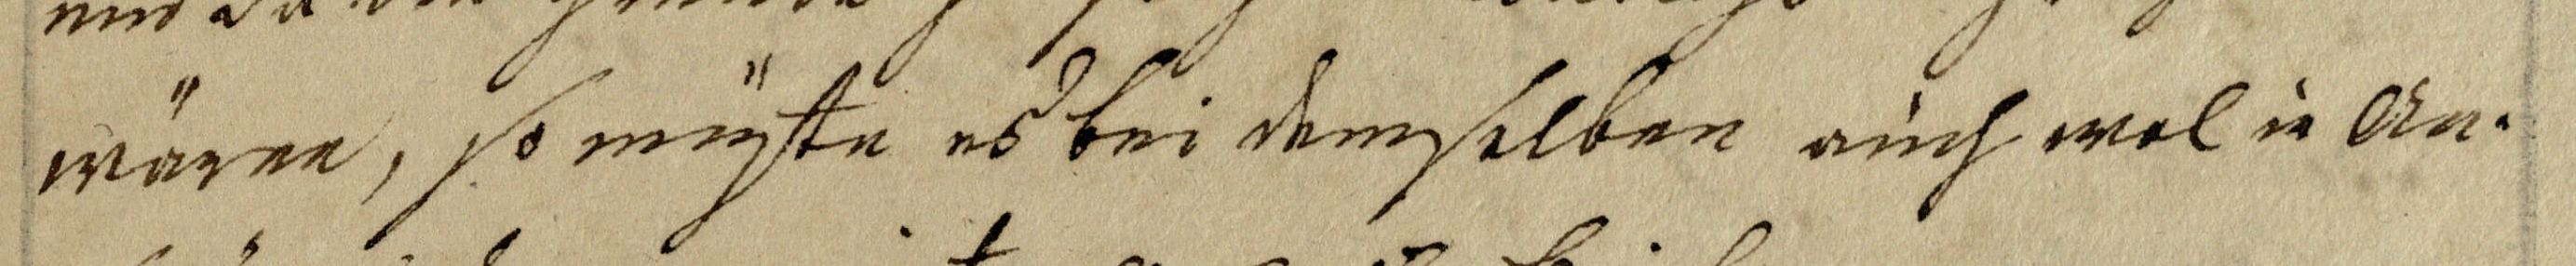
wären, so müste es bei demselben auch wohl in An¬
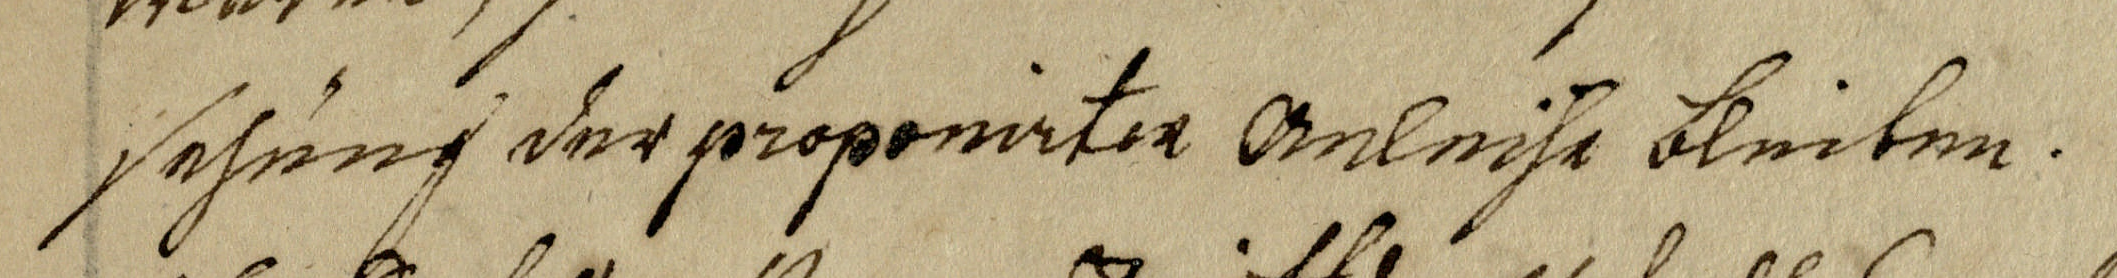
sehung der proponirten Anleihe bleiben.
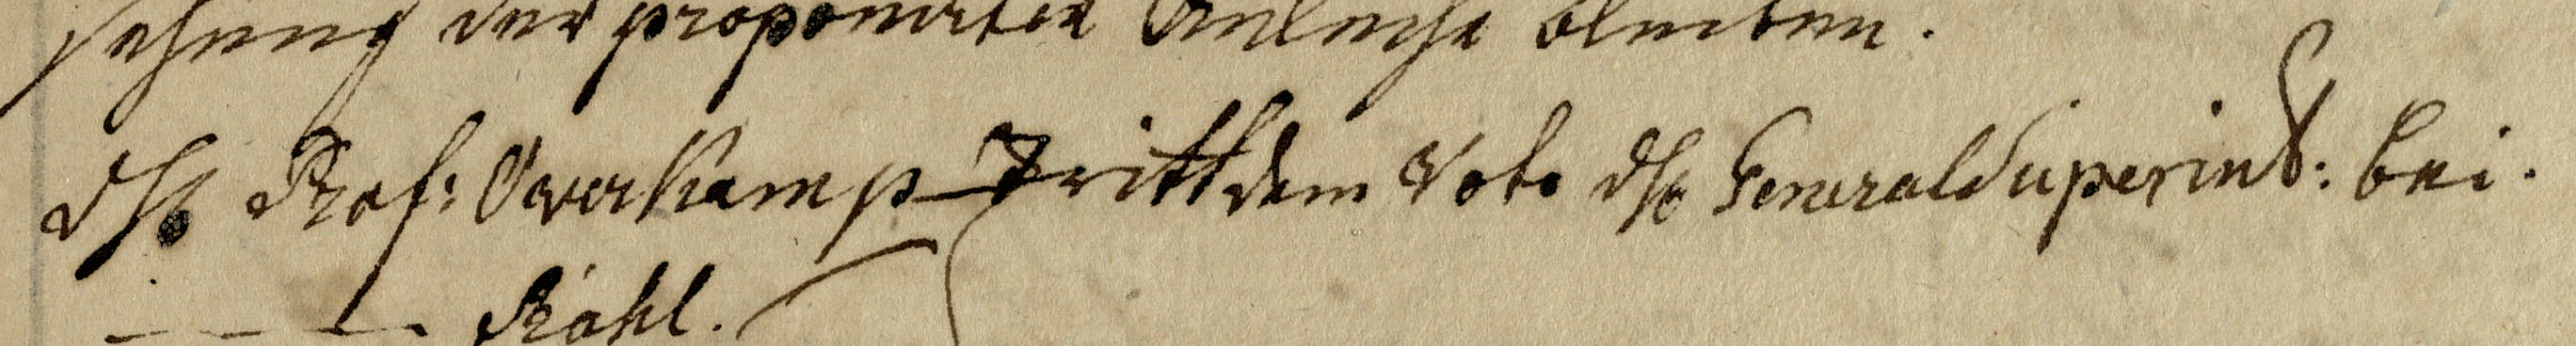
dh Prof. Overkamp tritt dem Voto dh GeneralSuperint. bei.
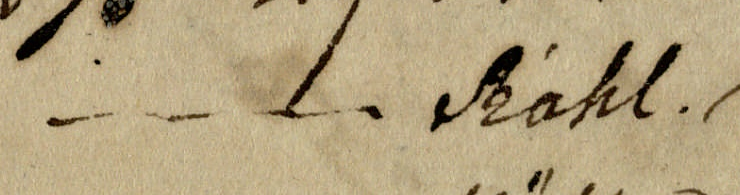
Röhl.
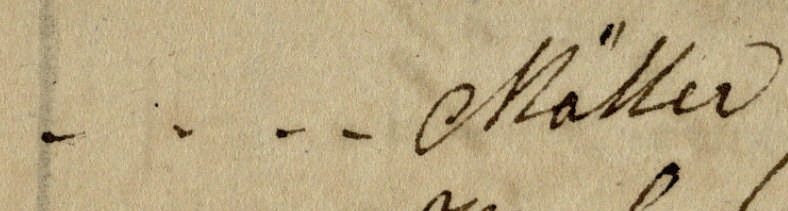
Möller
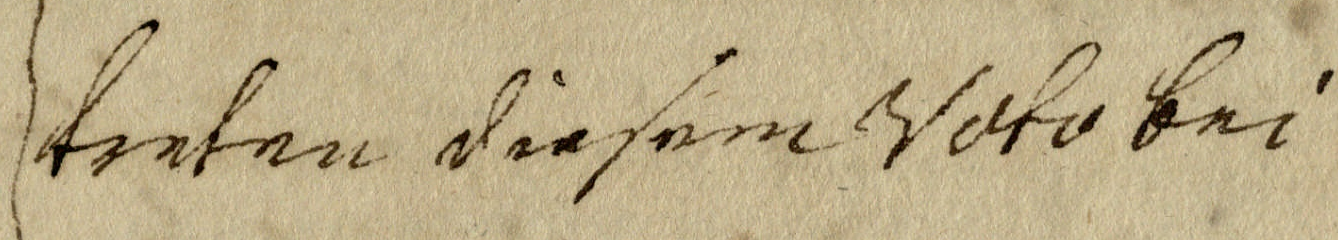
treten diesem Voto bei
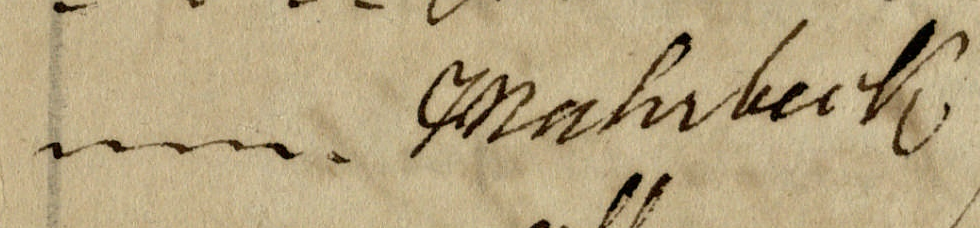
Muhrbeck
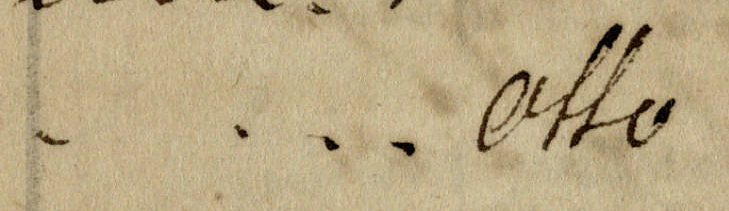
Otto
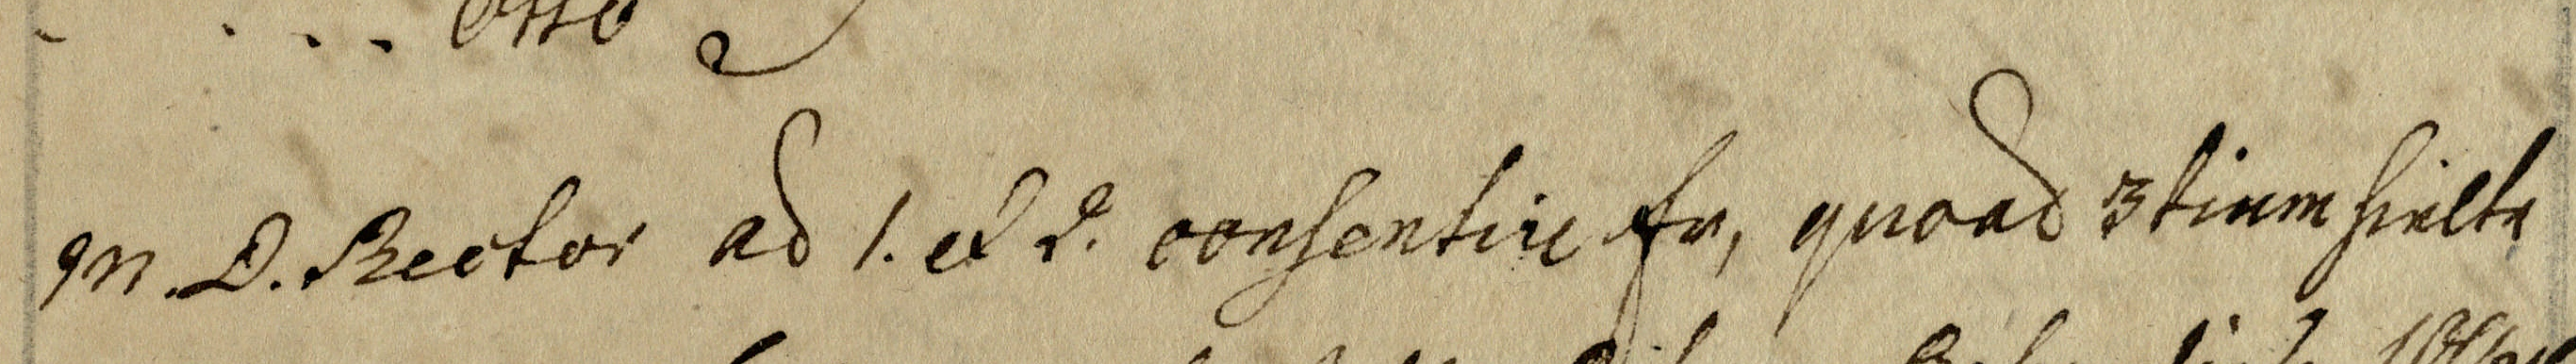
M. D. Rector ad 1. et 2. consentire Er quoad 3 tium hielte
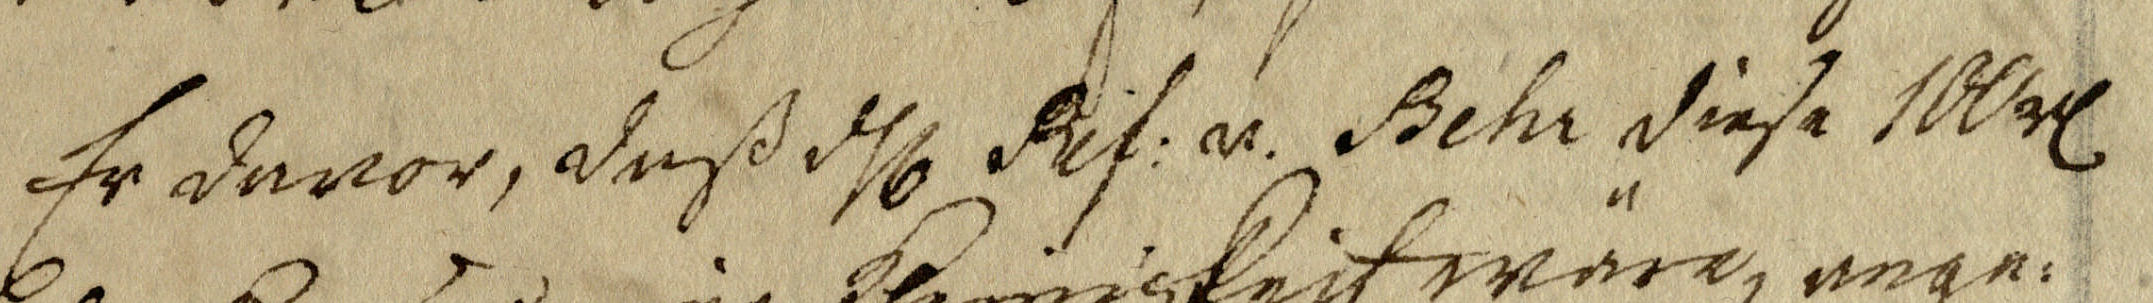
Er davor, daß dh Ref. v. Behr diese 100 rl
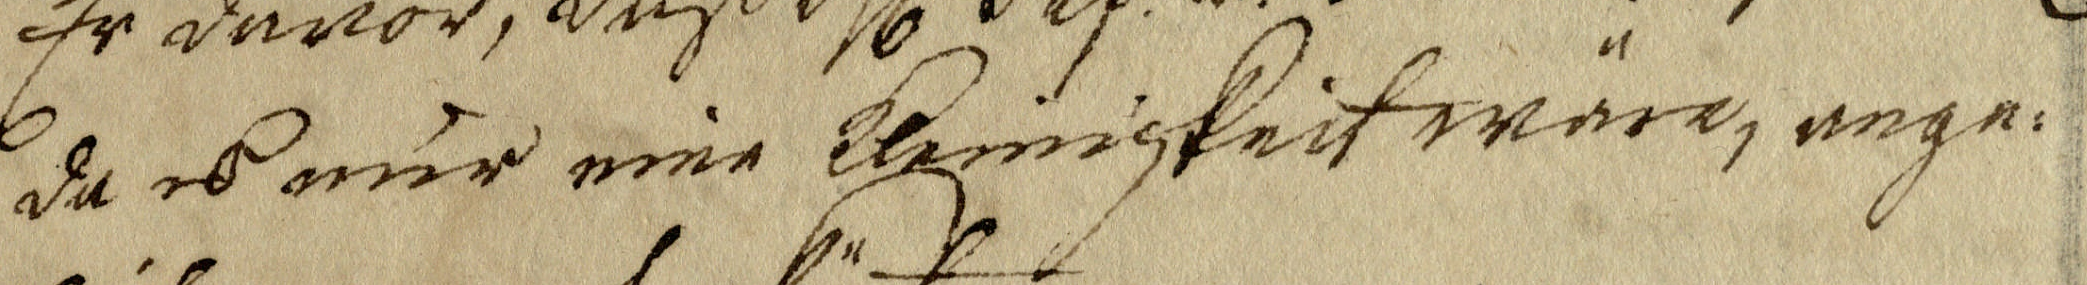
da es nur eine Kleinigkeit wäre, ange¬
